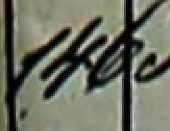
146
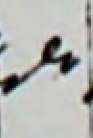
do
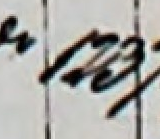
123
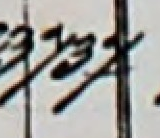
737
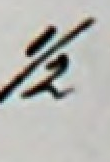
½
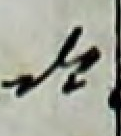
do
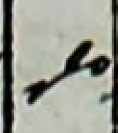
do
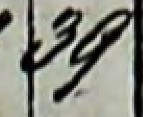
39
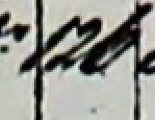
126
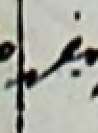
do
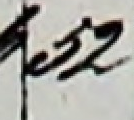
52
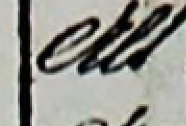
Alt
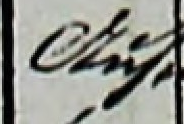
Aus„
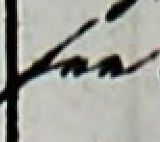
see
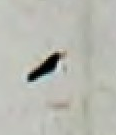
„
